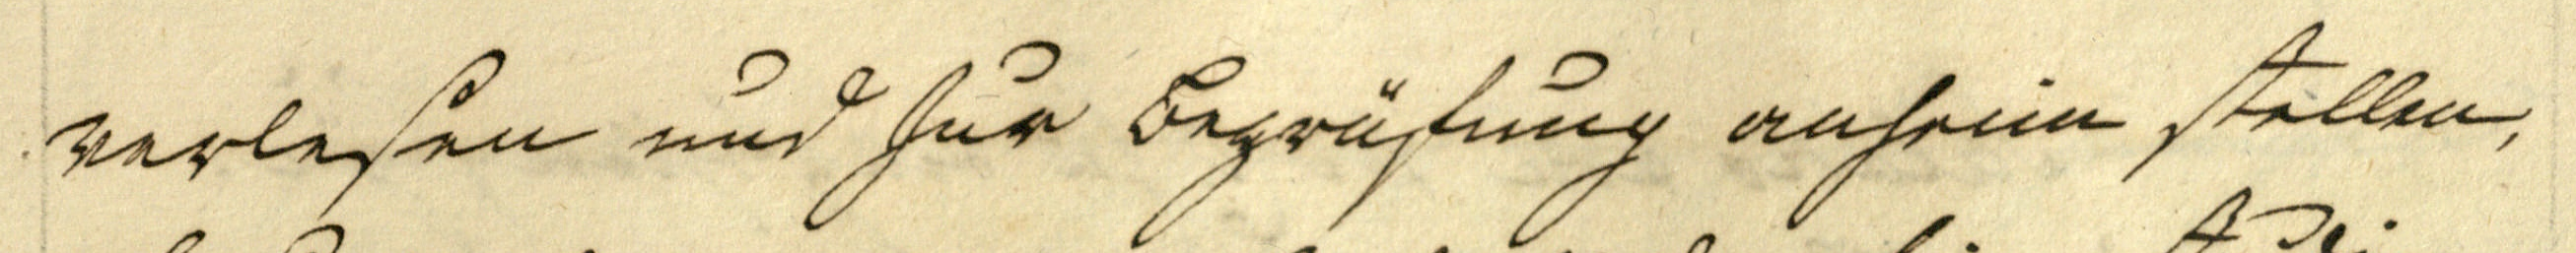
verlesen und zur Beprüfung anheim, stellen,
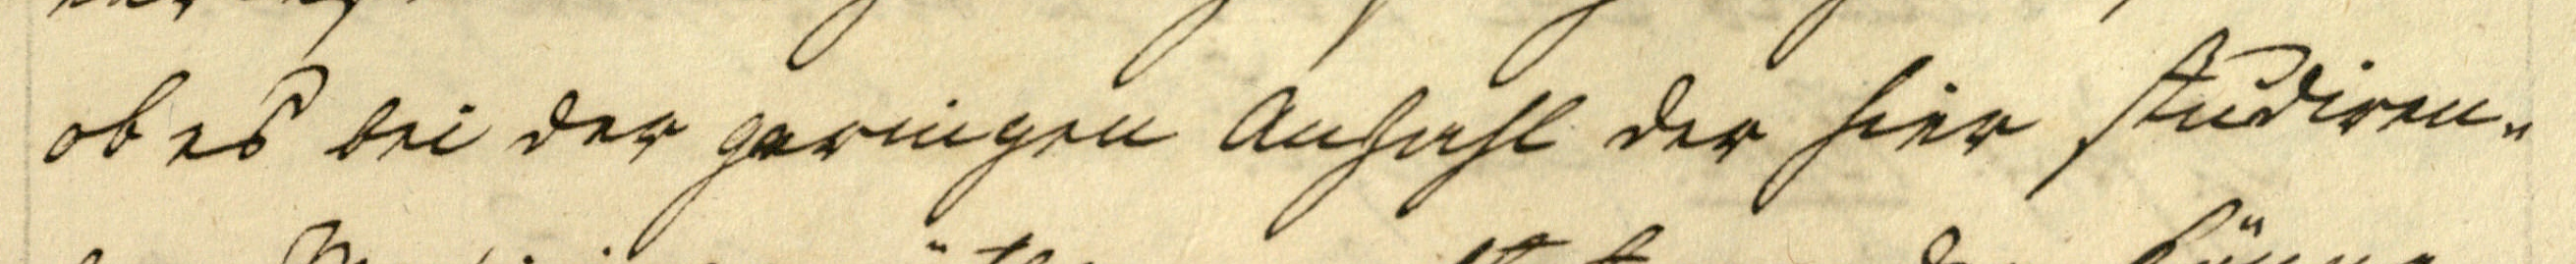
ob es bei der geringen Anzahl der hier studiren-
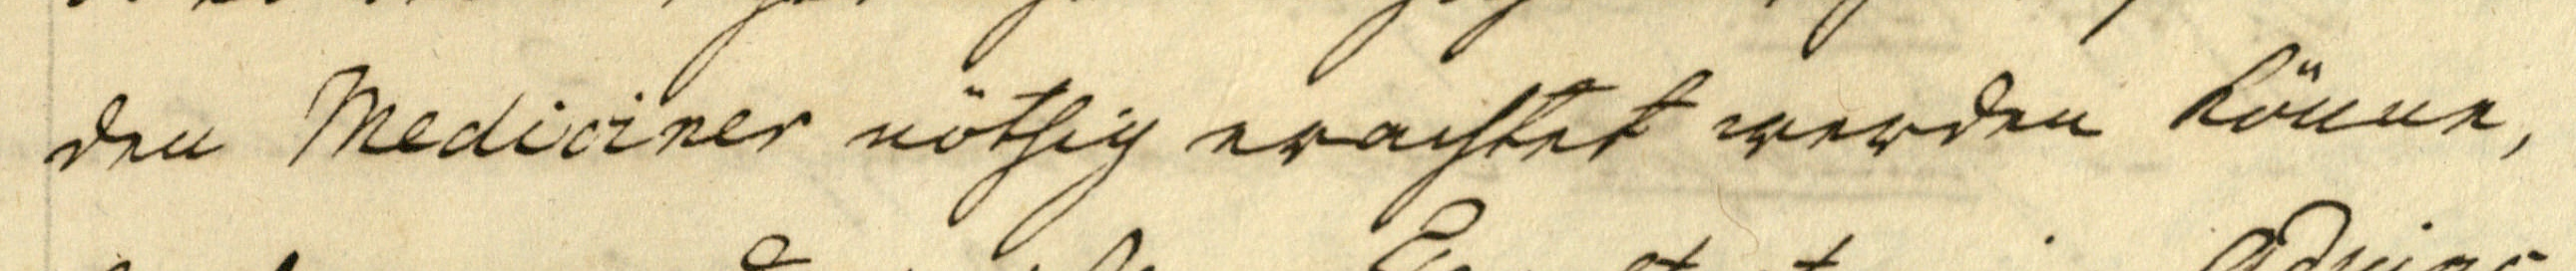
den Medciner nöthig erachtet werden könne
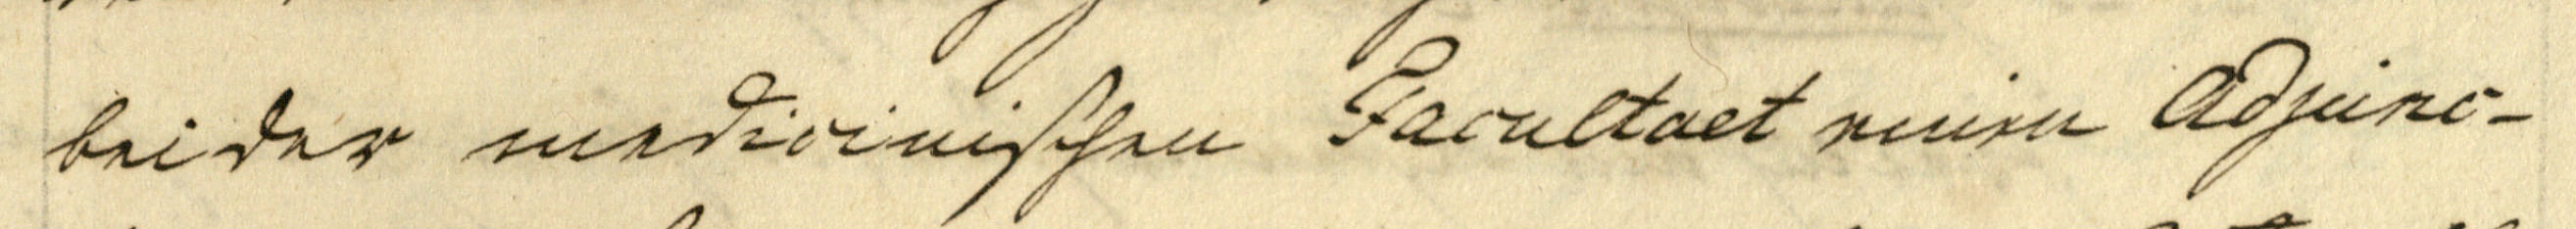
bei der medicinischen Facultaet einen Adjunc-
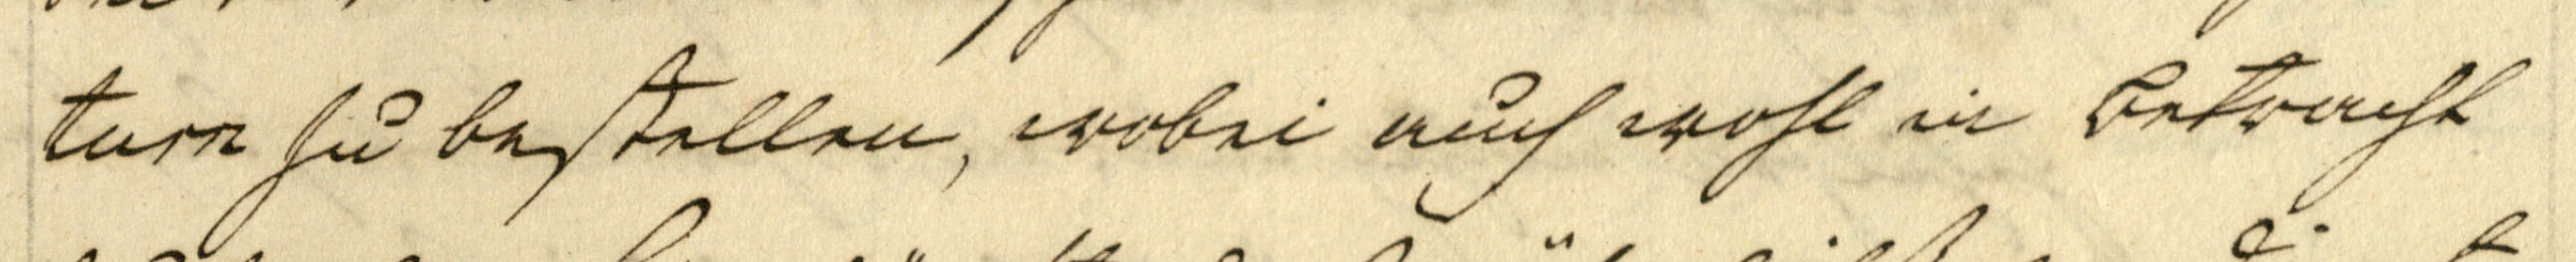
tum zu bestellen, wobei auch wohl in Betracht
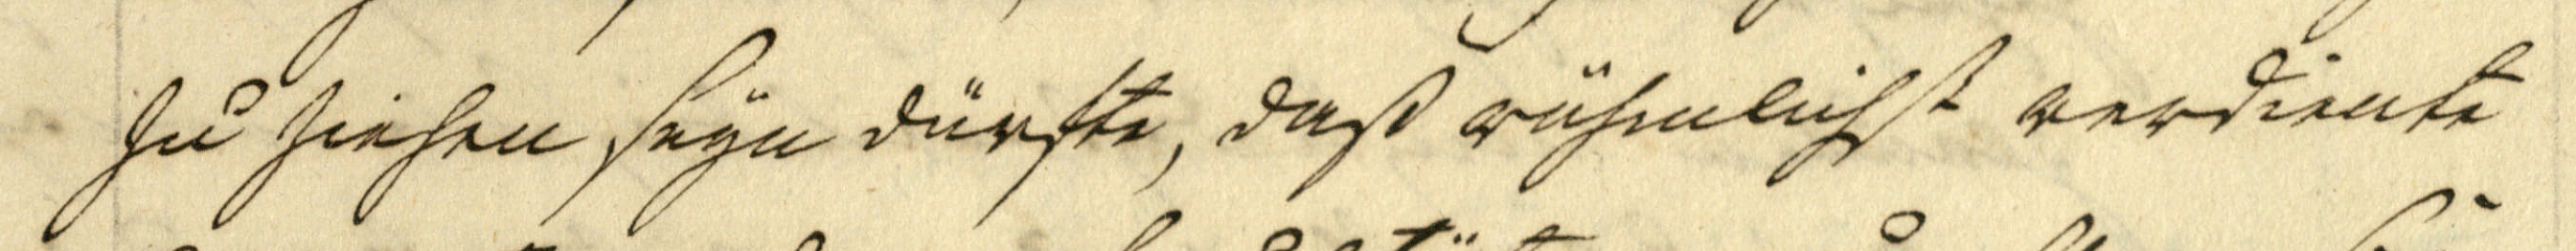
zu ziehen seyn dürfte, daß rühmlichst verdiente
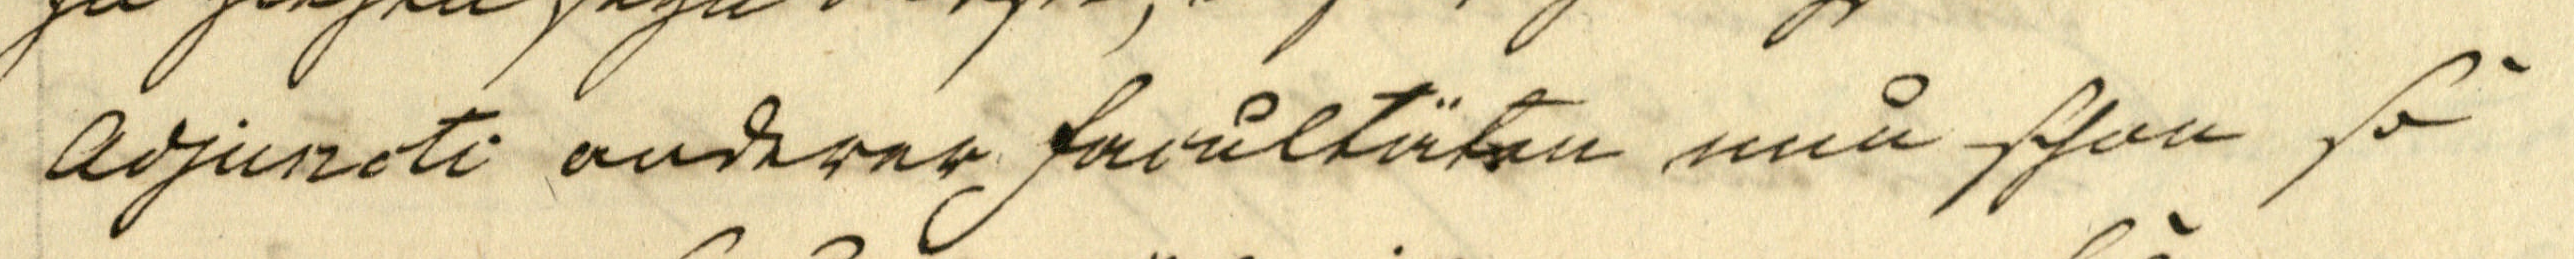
Adjuncti anderer Facultäten nun schon so
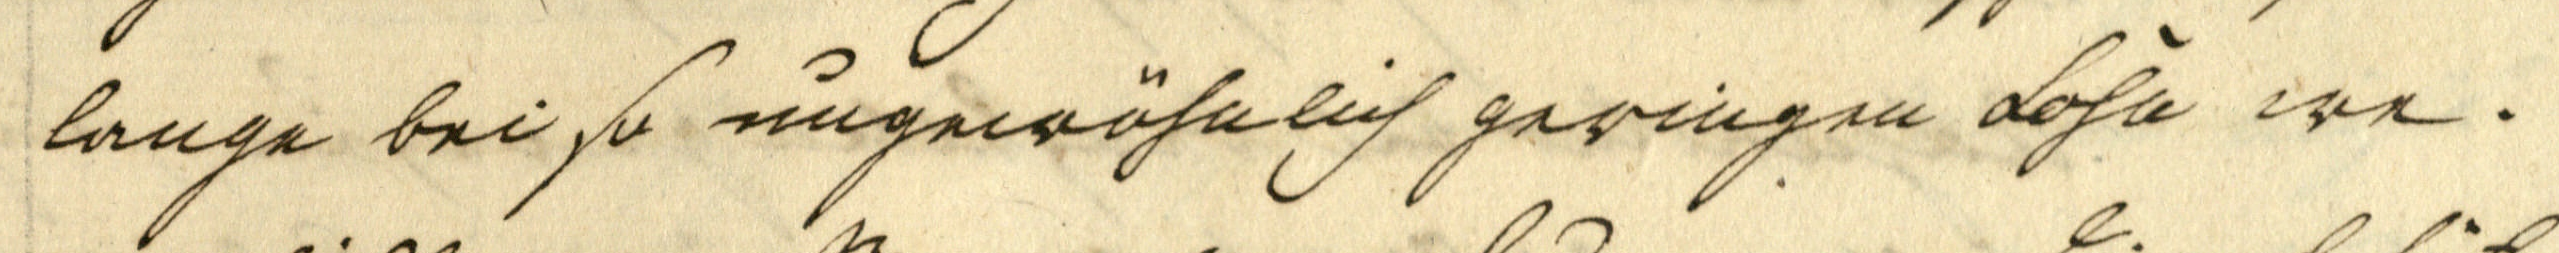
lange bei so ungewöhnlich geringen Lohn we-
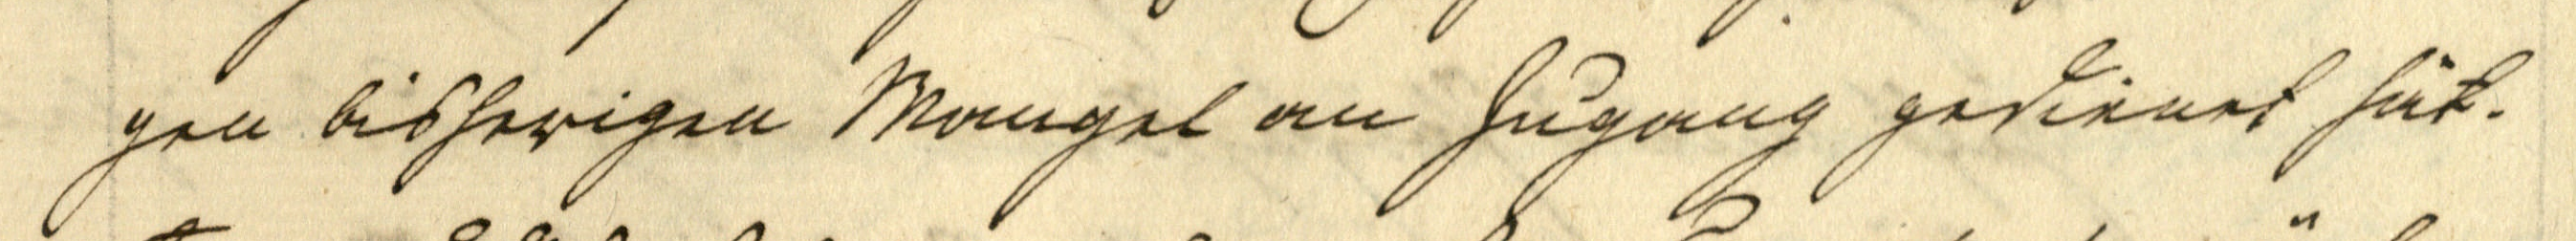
gen bisherigen Mangel an Zugang gedient hät-
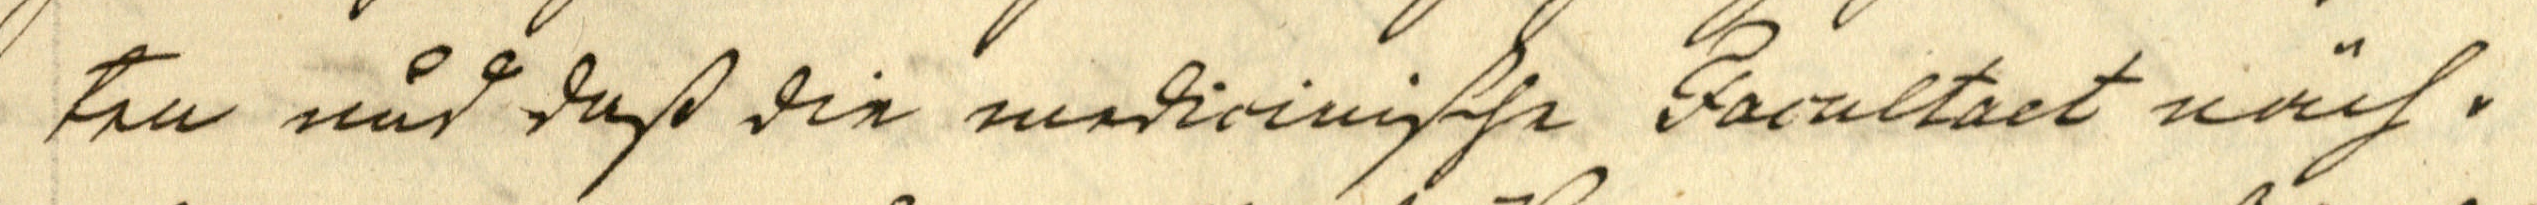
ten und daß die medicinische Faultaet näch-
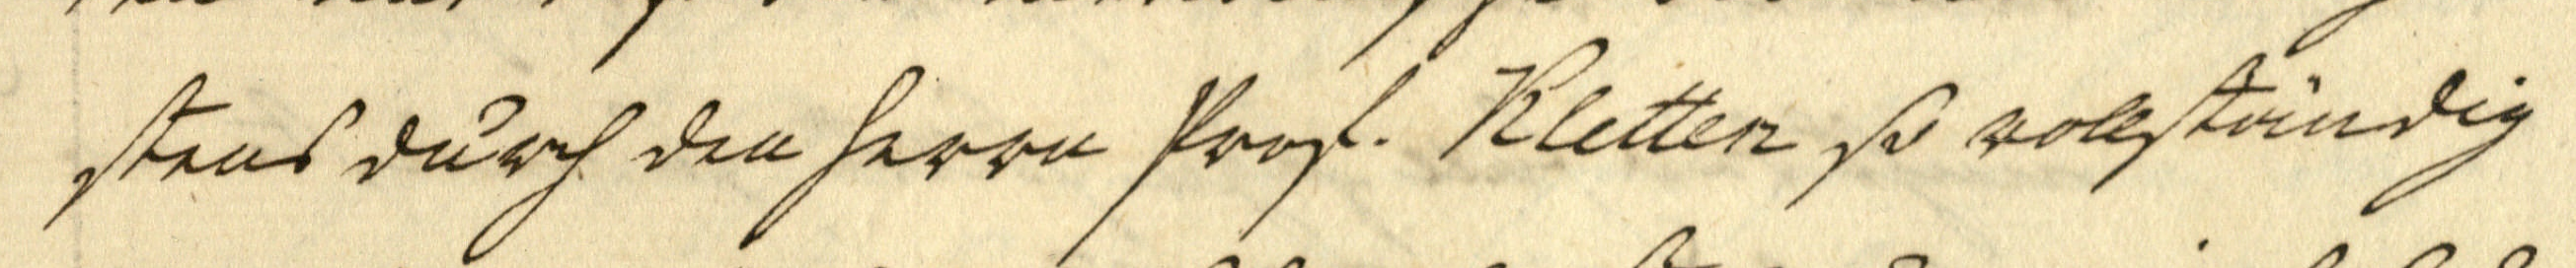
stens durch den Herrn Prof. Kletten so vollständig
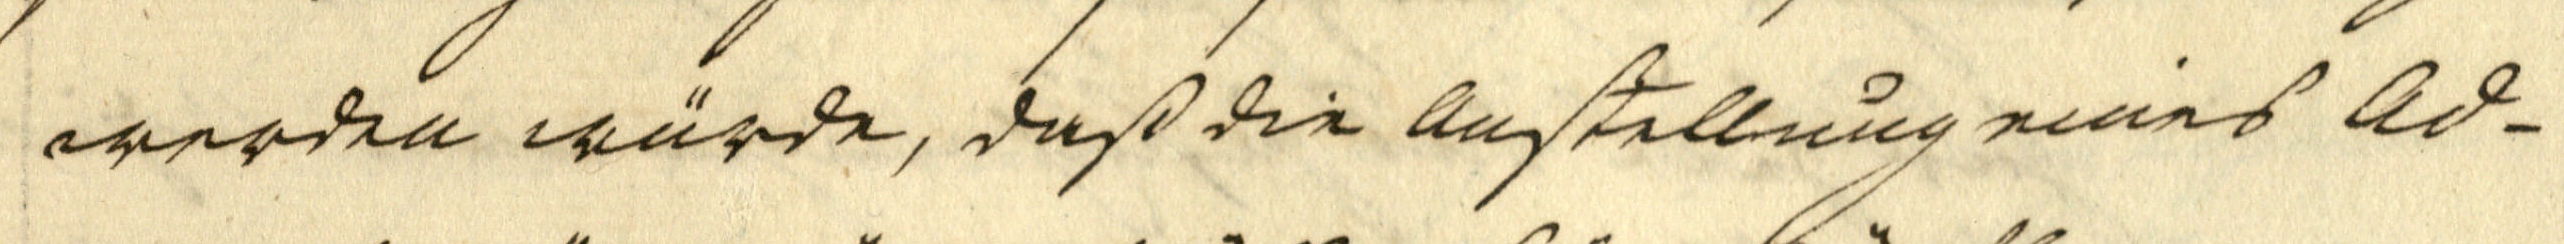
werden würde, daß die Anstellung eines Ad-
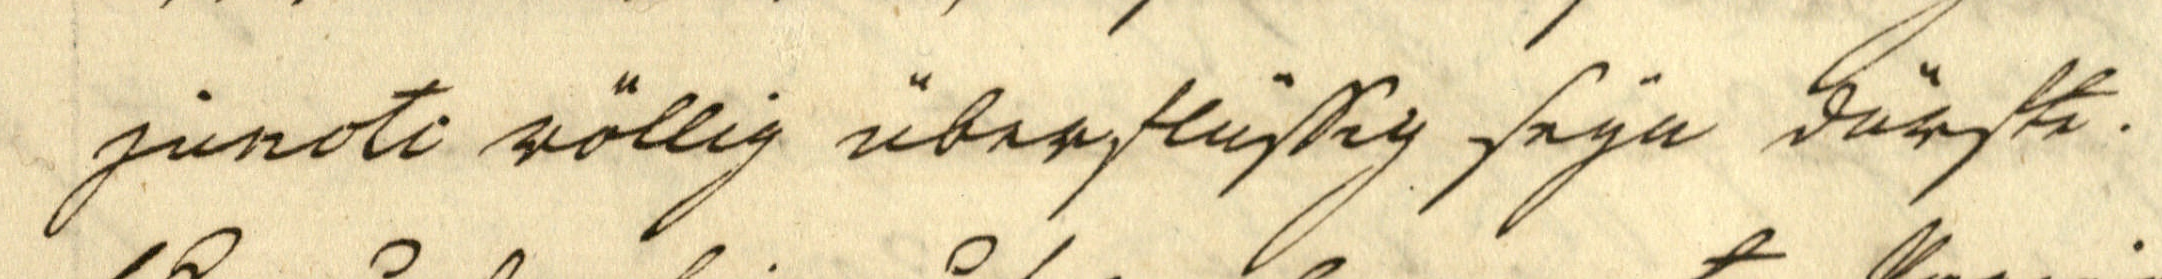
juncti völlig überflüssig seyn dürfte.
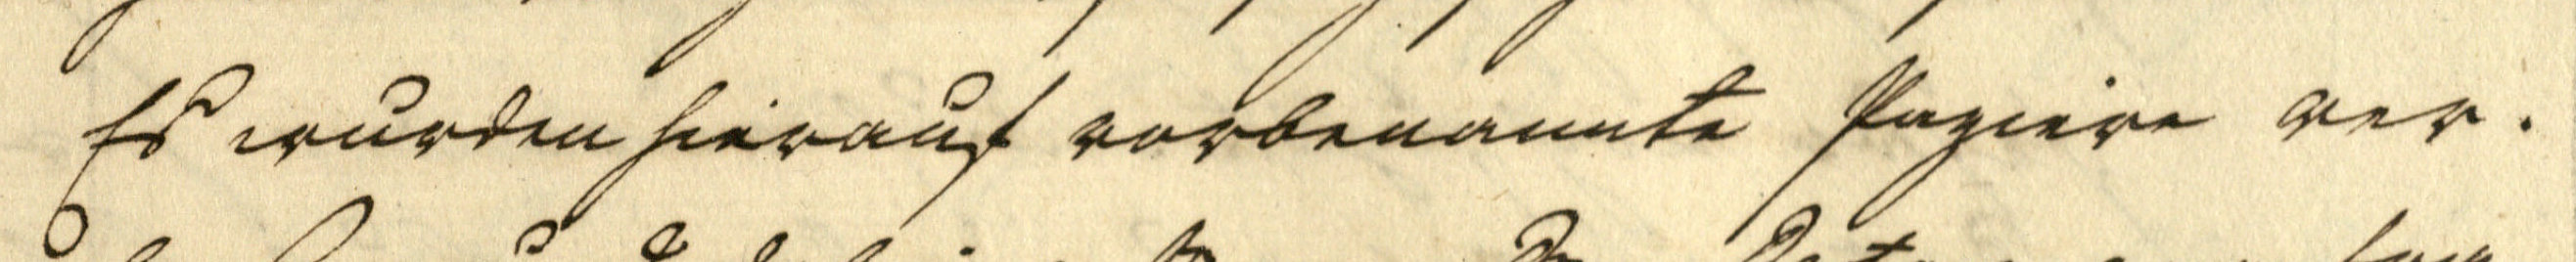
Es wurden hierauf vorbenannte Papiere ver-
